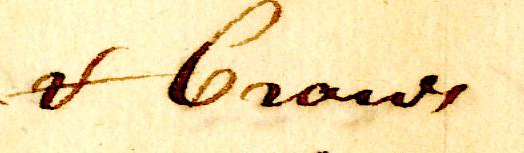v Craws
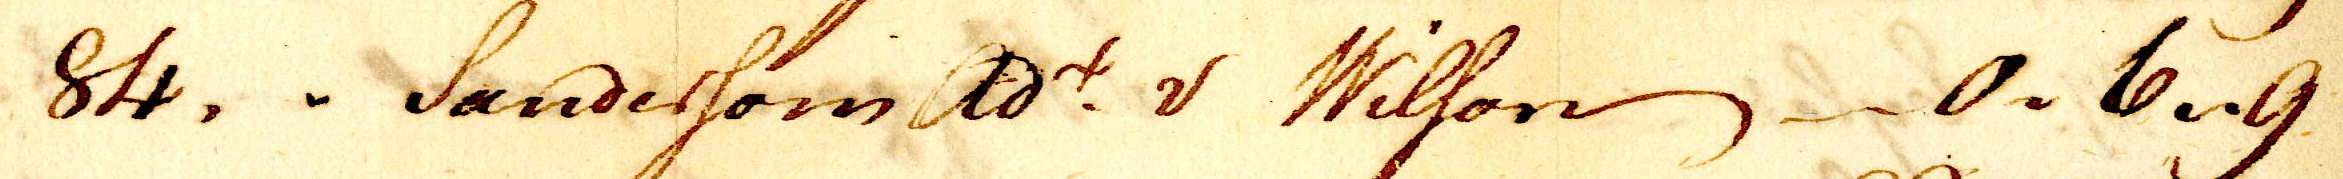84. Sanderson Ad^t. v Wilson- 0.6.9
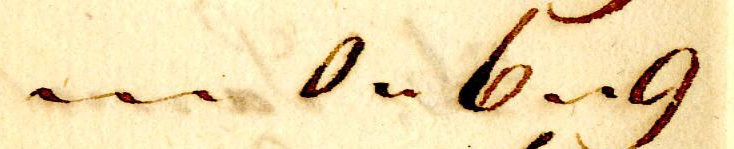- O.6-9
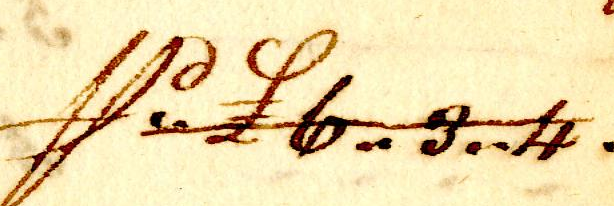P^d. £6..3..4
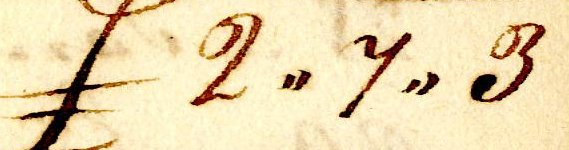£2.. 7.. 3
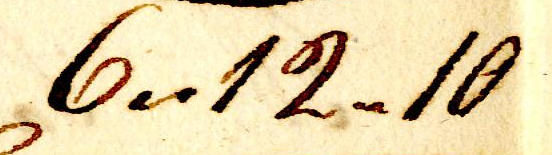6. 12. 10
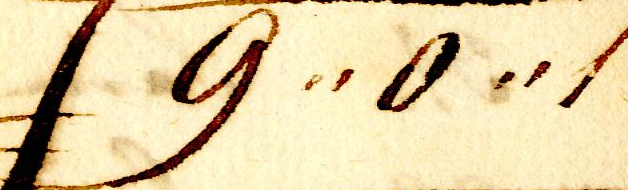£9 .. 0.. 1
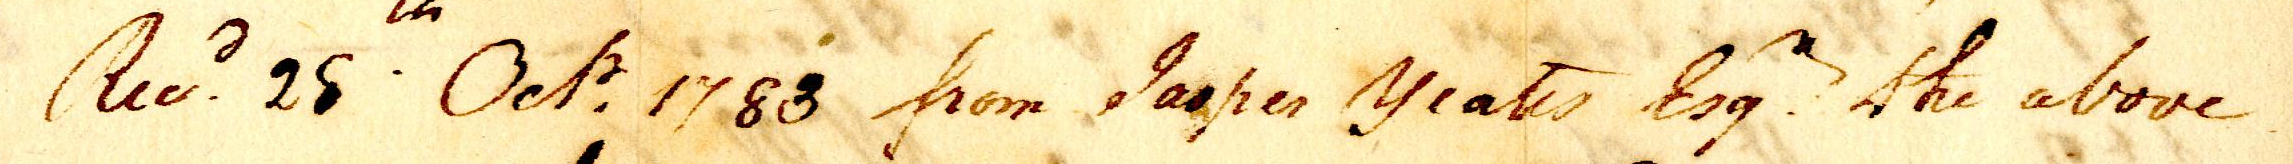Rec^d. 25^th Oct^r. 1783 from Jasper Yeates Esq^r. the above
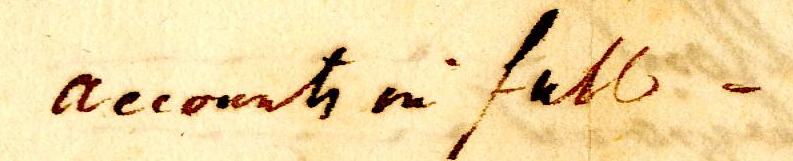accounts in fall
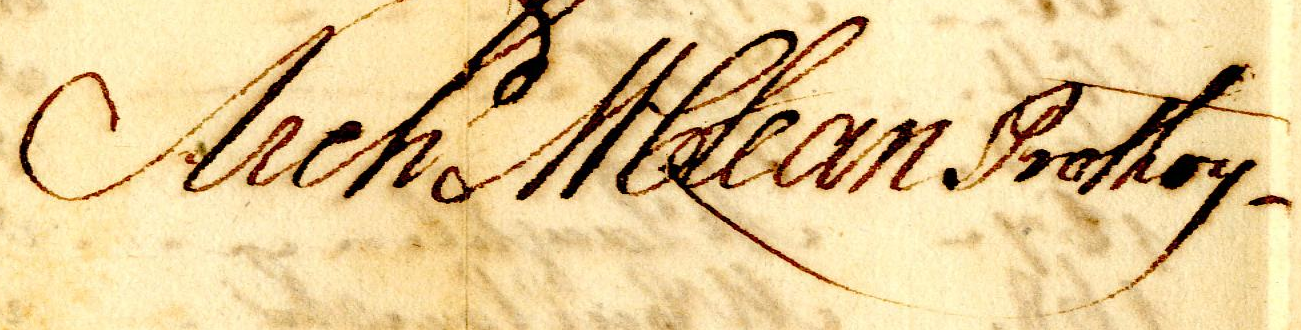Arch^d. M^cClean Prothoy
